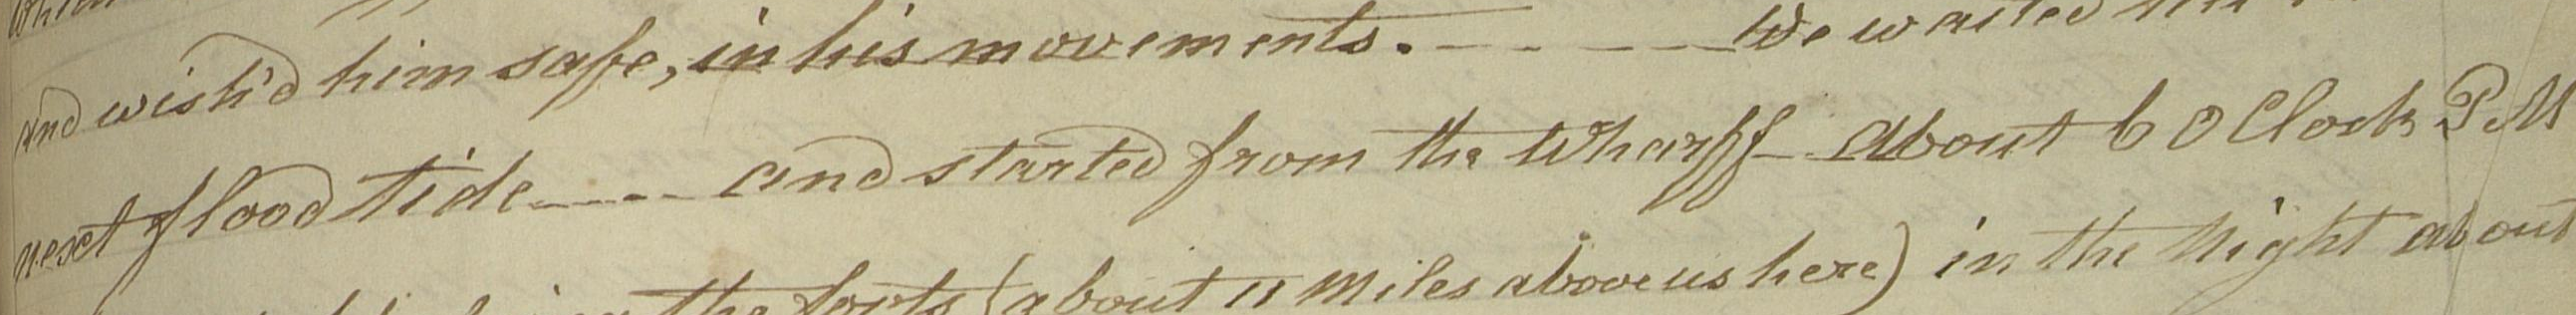next flood tide. and started from the Wharff about 6 OClock PM
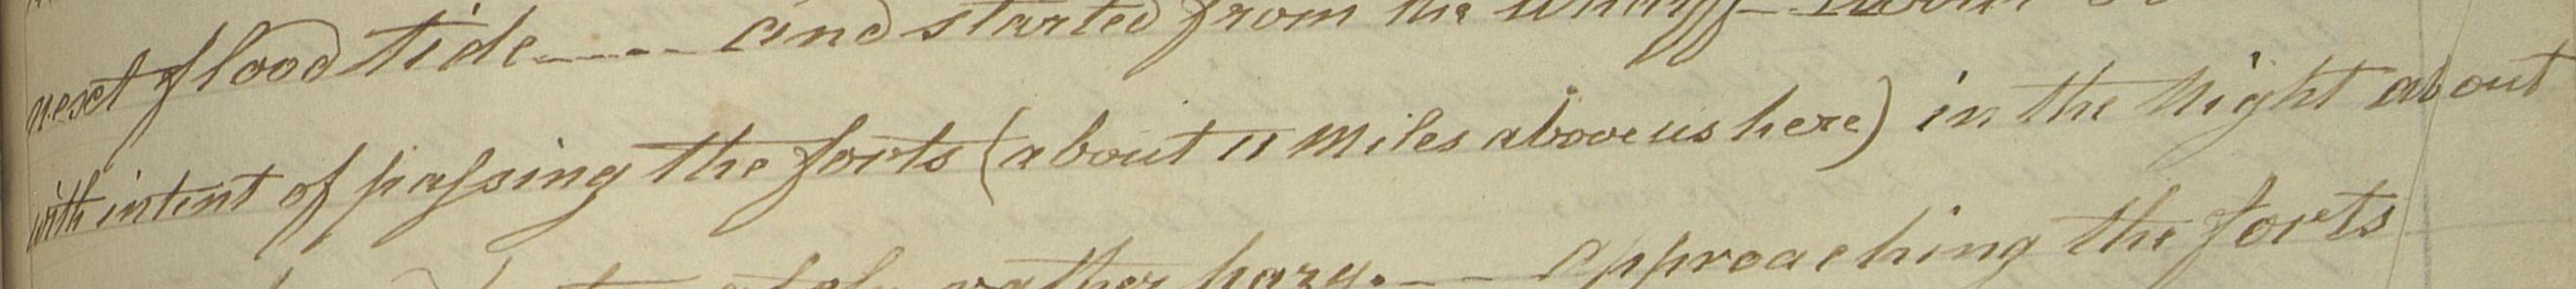with intent of passing the forts (about 11 Miles above us here) in the Night about
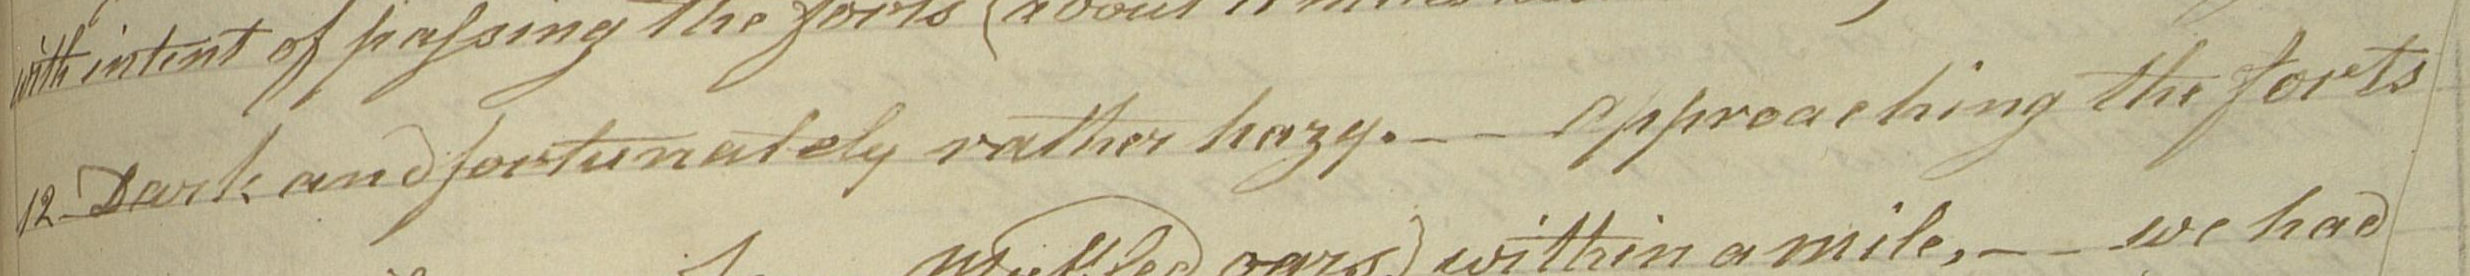a Dark and fortunately rather hazy. approaching the forts
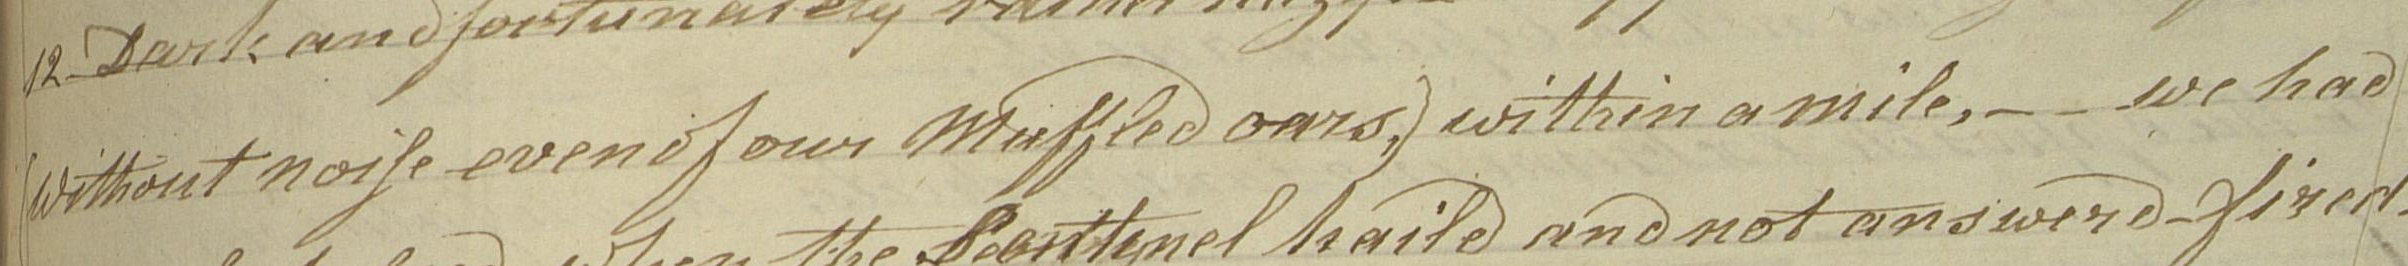without noise even of our Muffled oars,) within a mile, we had
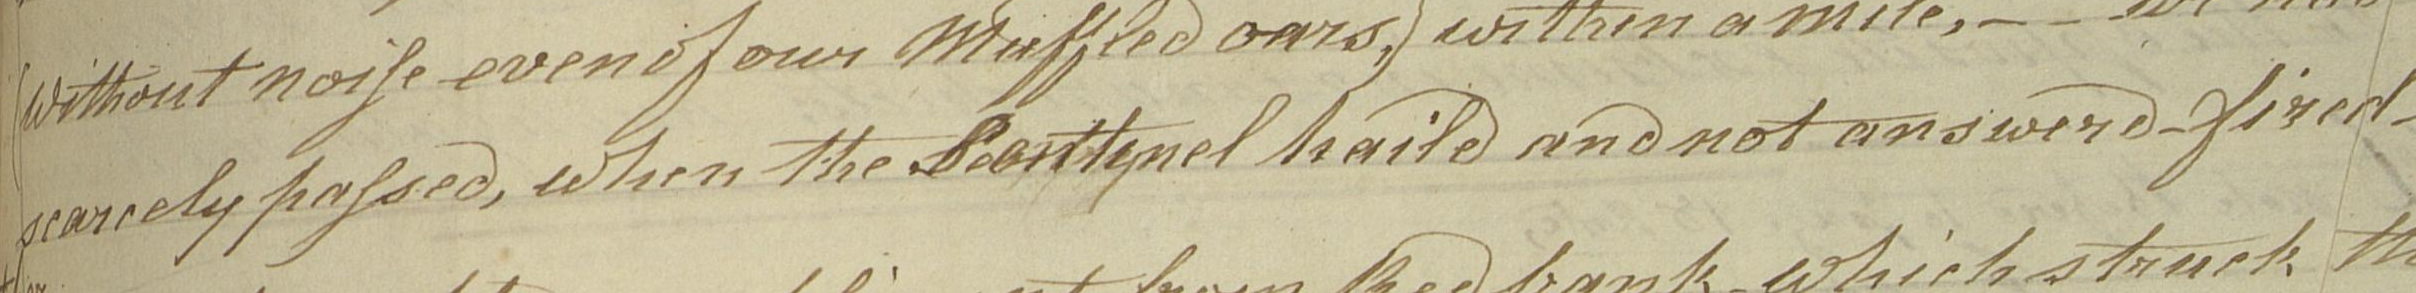scarcely passed, when the Sentinel hail'd and not answerd fired
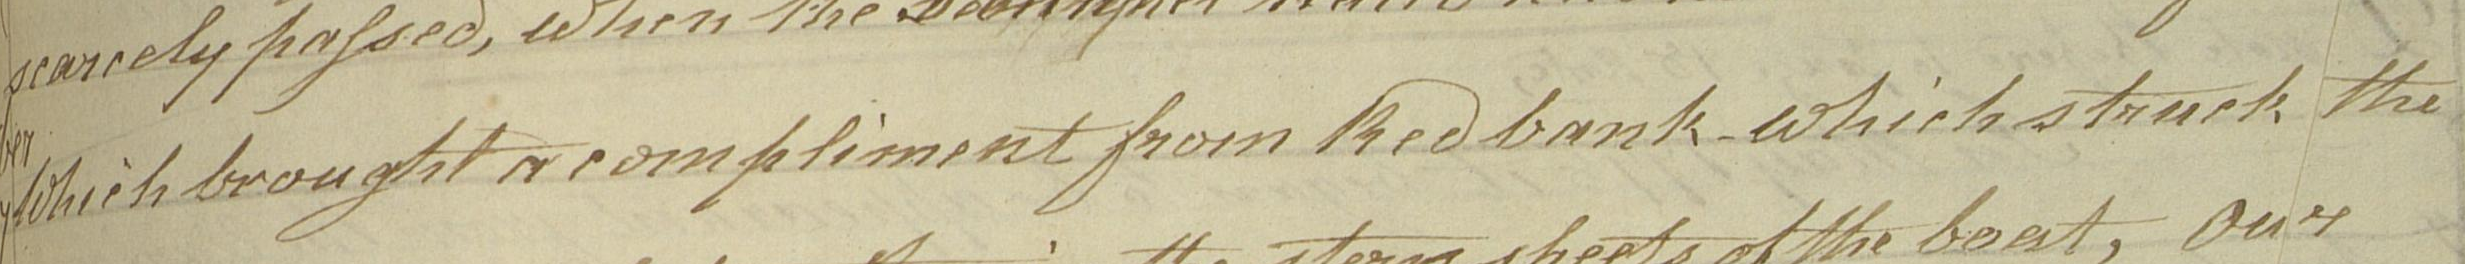which brought a compliment from Red bank which struck the
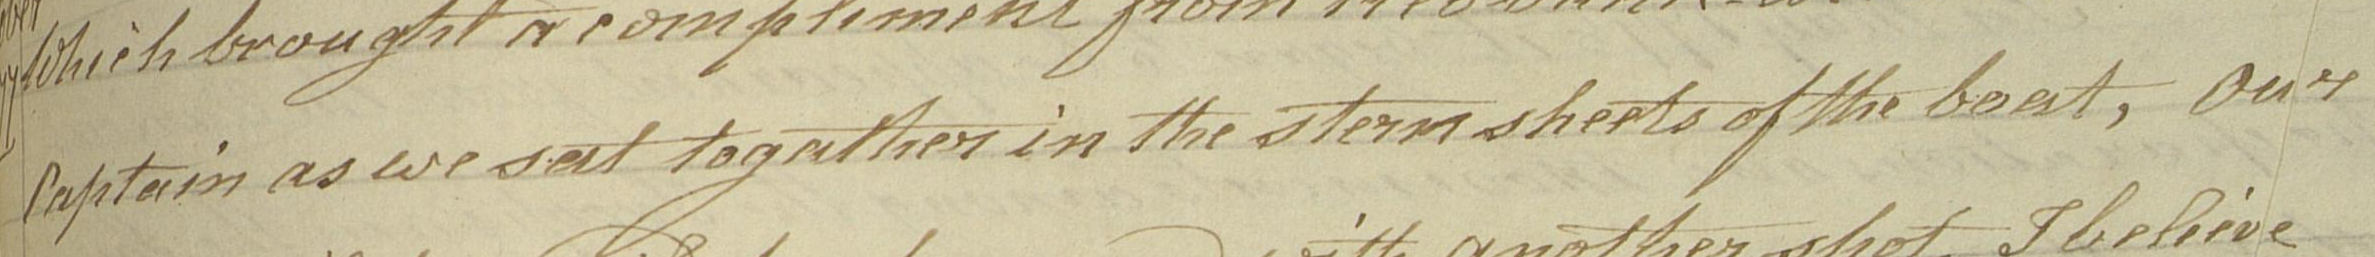captain as we sat togather in the stern sheets of the boat, our
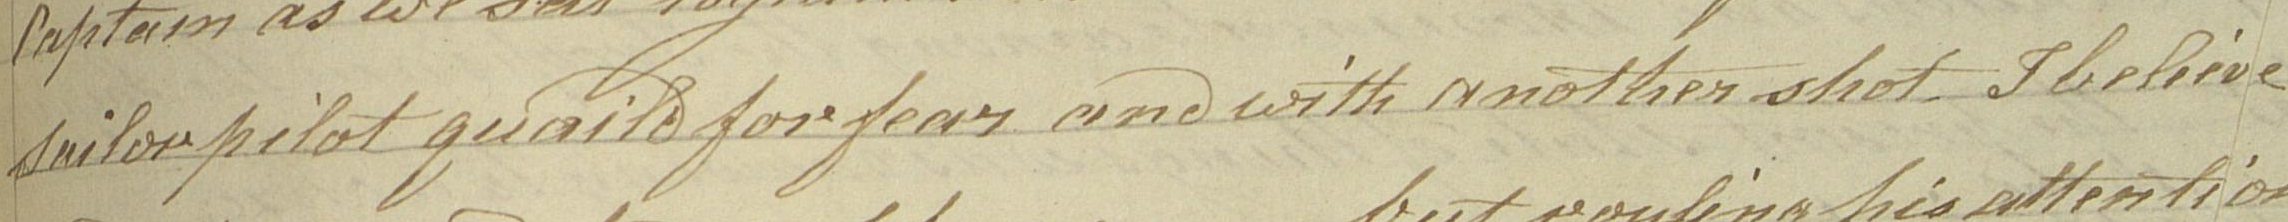sailor pilot quaild for fear and with another shot I believe
